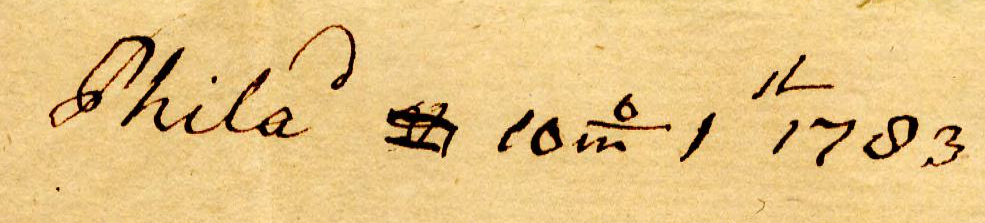Phila^d [_] 10 m^o 1^st 1783
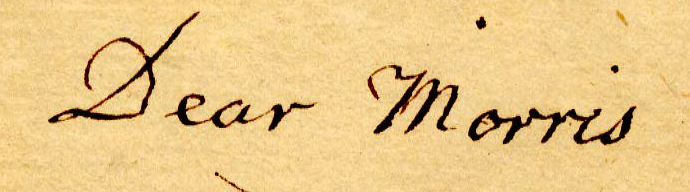Dear Morris
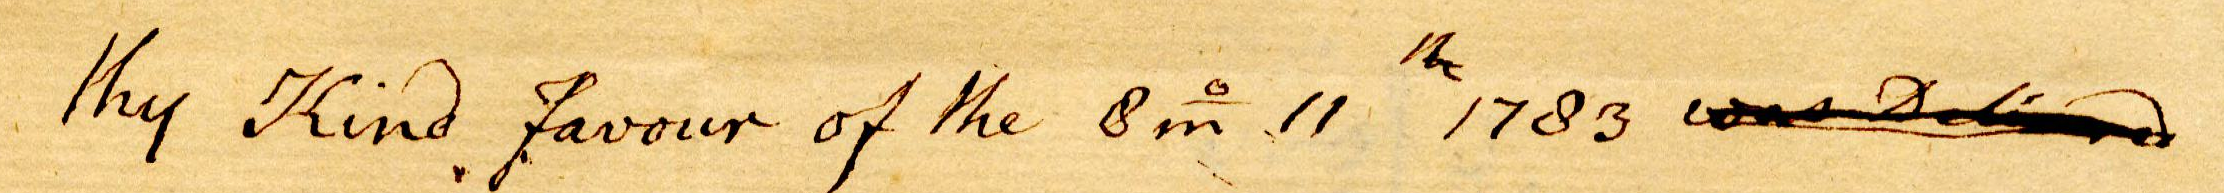thy Kind favour of the 8 m^o 11^th 1783 [was Delivered]
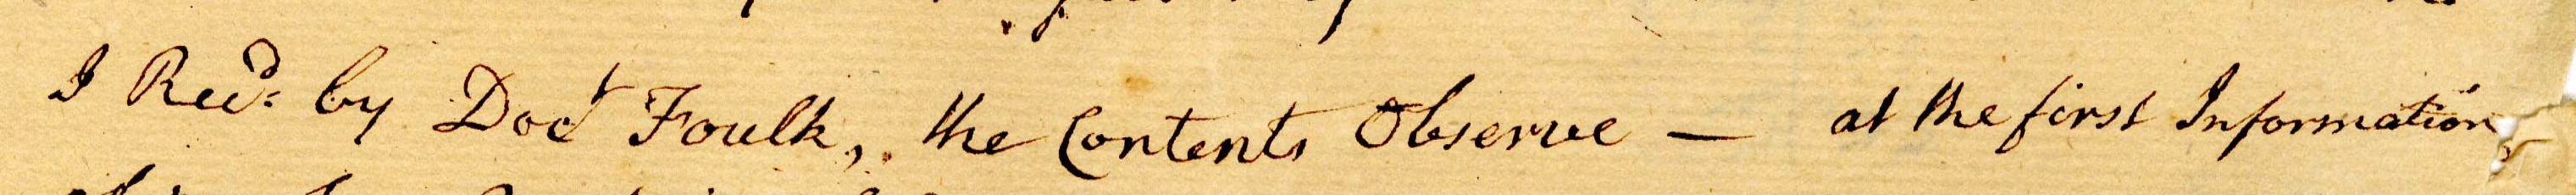I Rec^d: by Doc^t Foulk, the Contents Observe - at the first Information
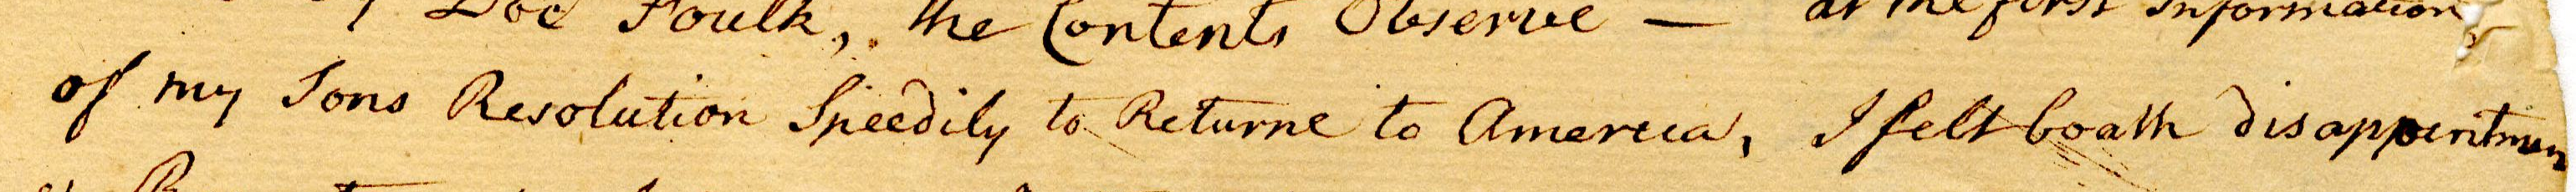of my sons Resolution Speedily to Returne to America, I felt boath disappointment
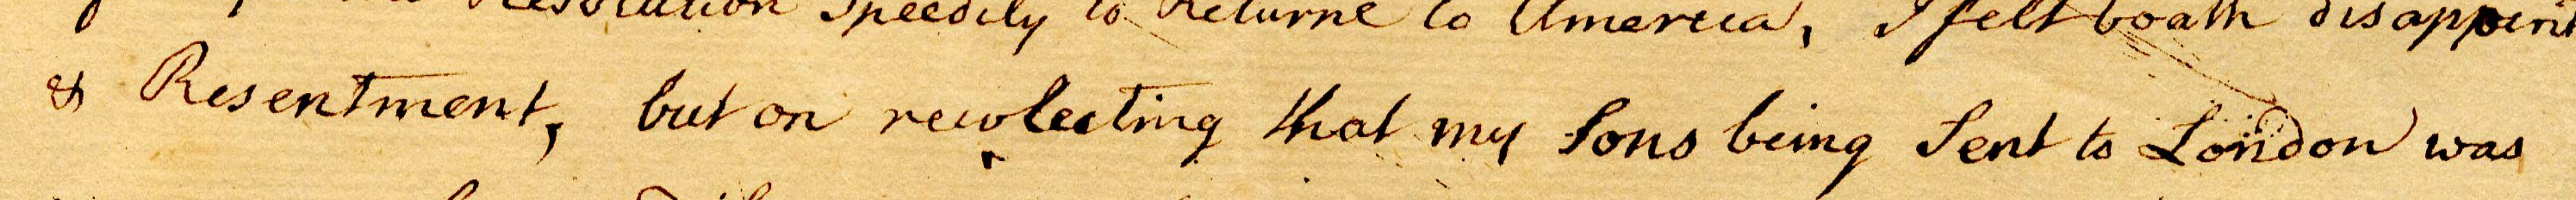& Resentment, but on recolecting that my sons being sent to London was
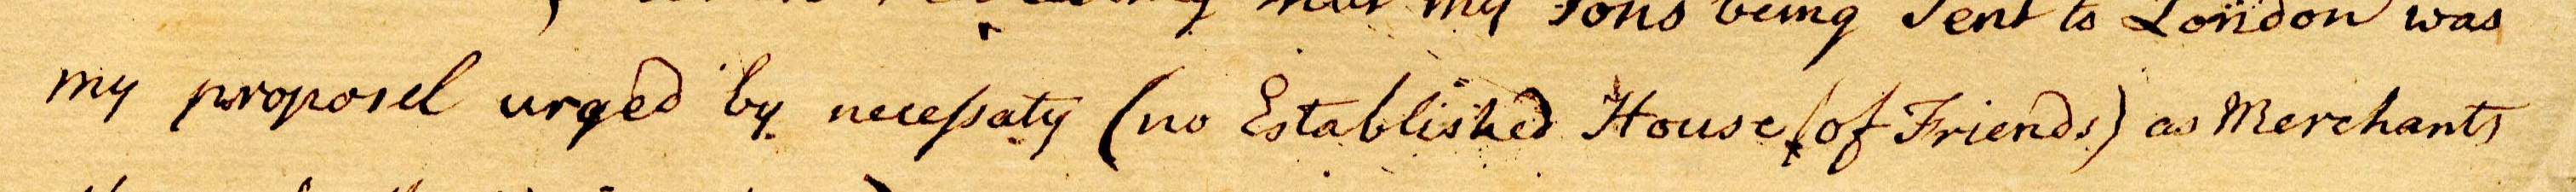my proposel urged by necessaty (no Established House (of Friends) as Merchants
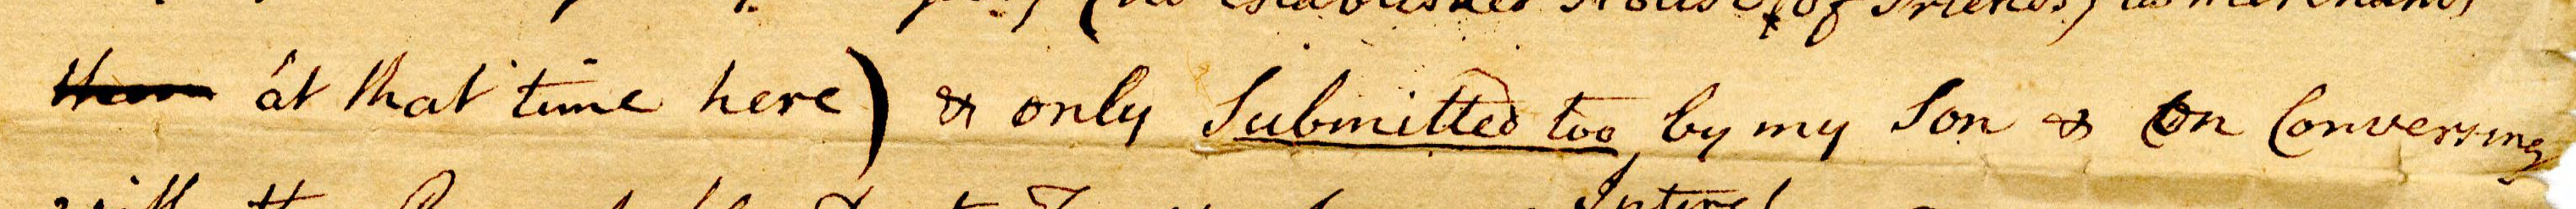[there] at that time here) & only Submitted too by my Son & on Conversing
